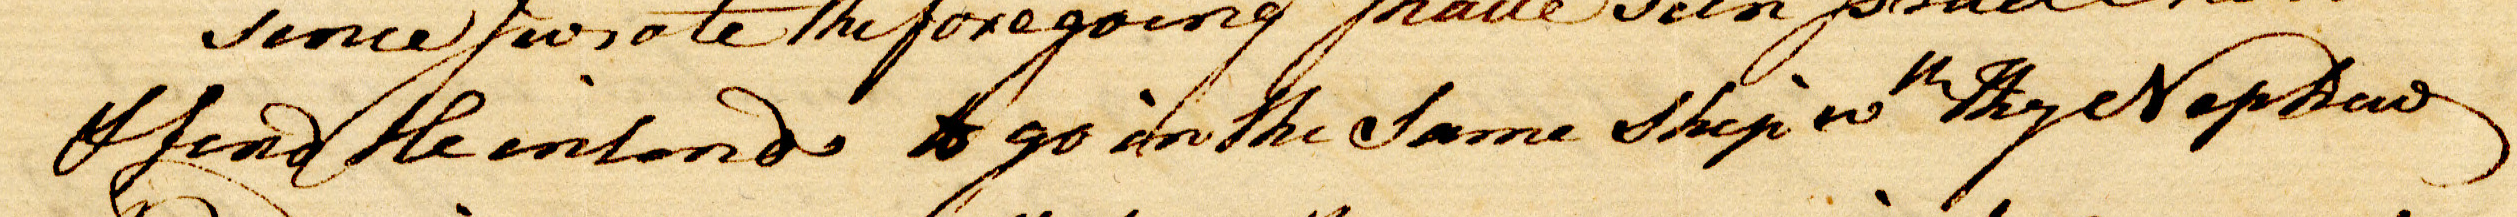& send He intends to go in the Same Ship w^th Thy Nephew
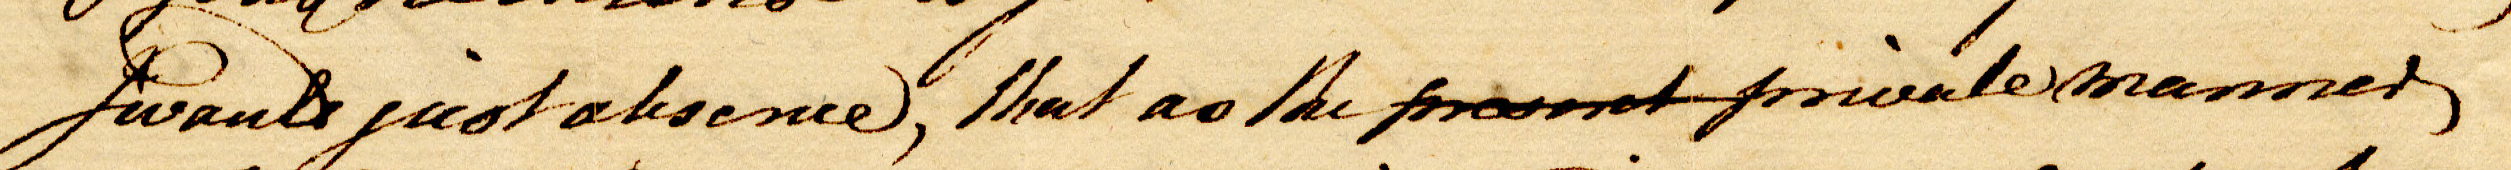I would just absence, that as the private manner
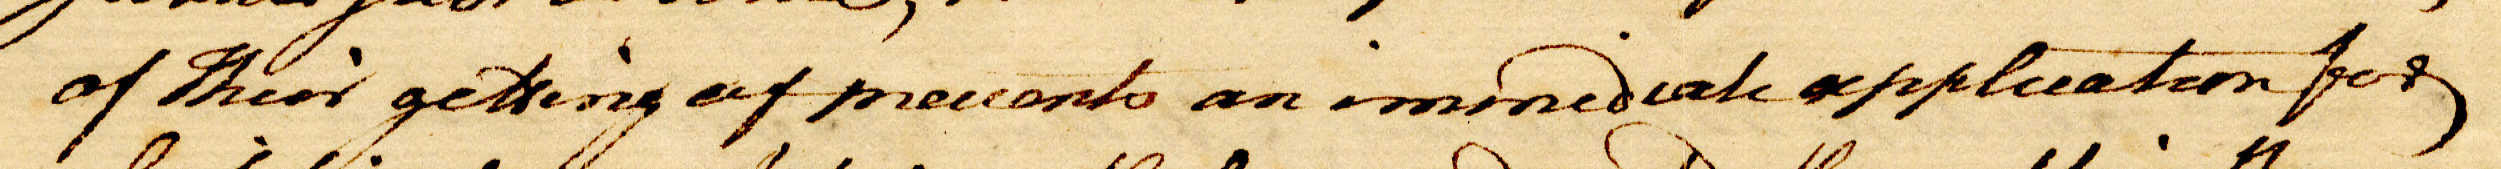of their getting at present an immediate application for
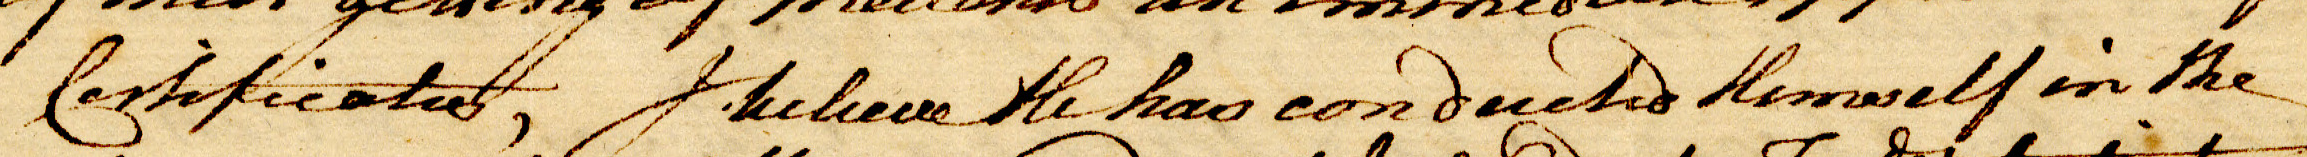Certificates, I believe He has conducted Himself in the
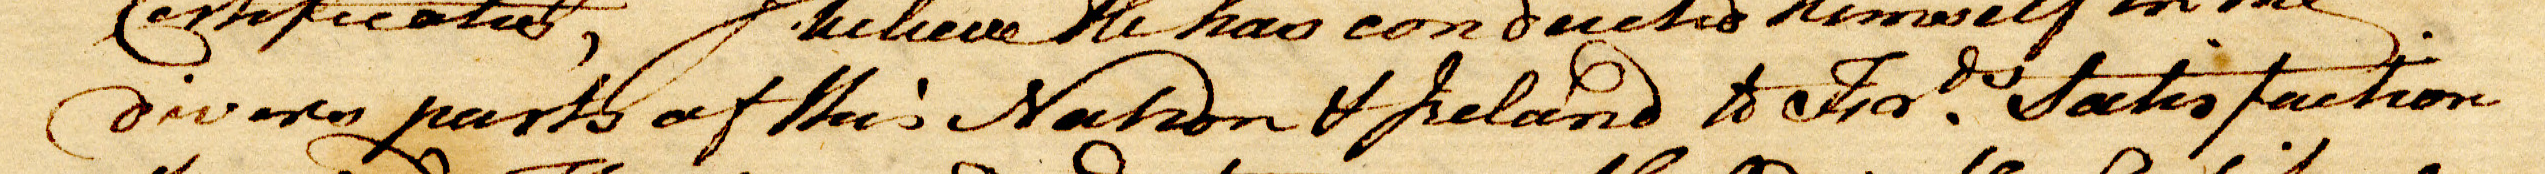divers parts of this Nation & Ireland to Fr^ds. Satisfaction
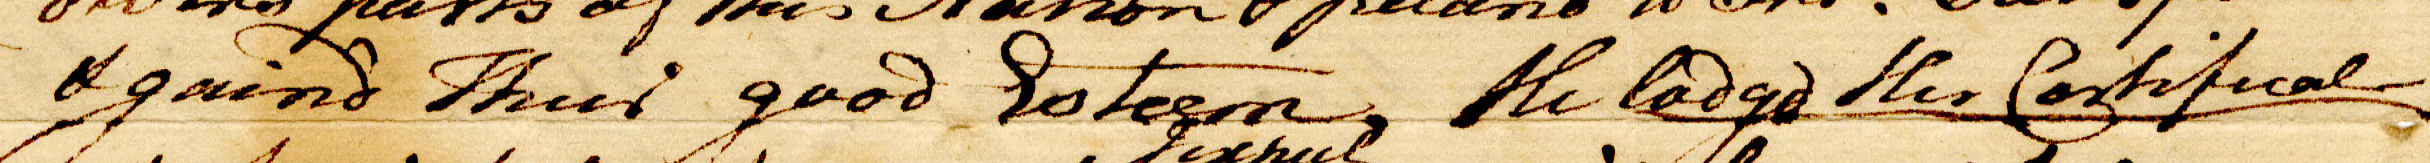& gaind Their good Esteem, He lodged His Certificat
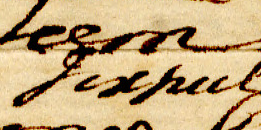I expect
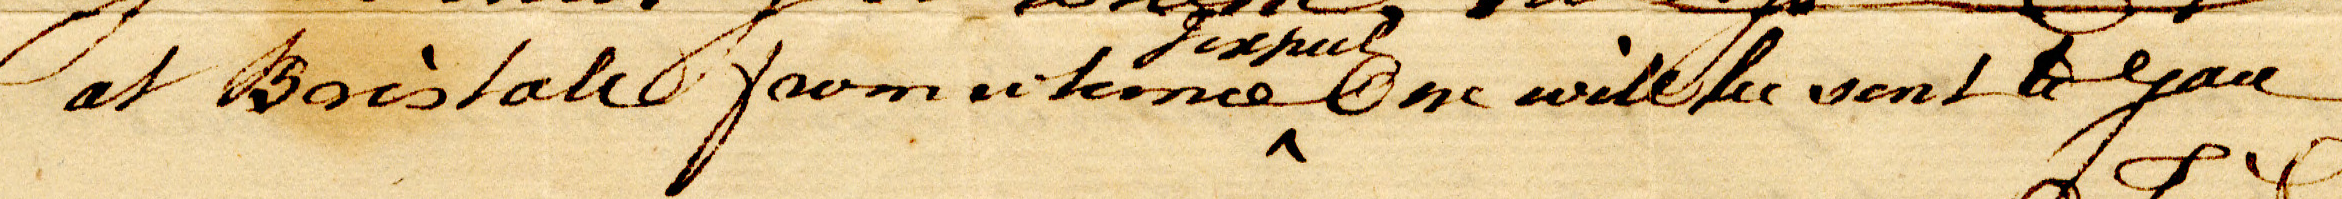at Bristol from whence ^ one will be sent to you.
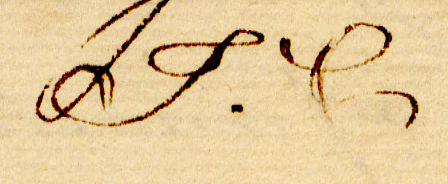T.C
